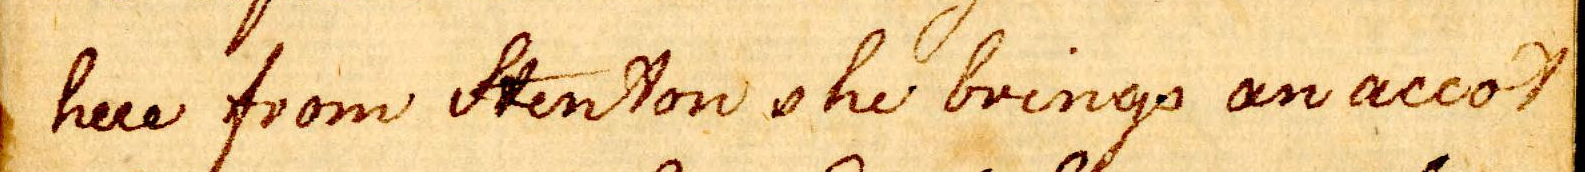here from Stenton she brings an accot
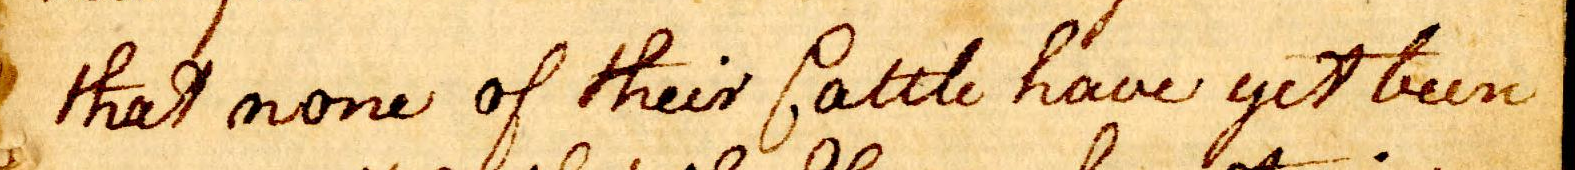that none of their Cattle have yet been
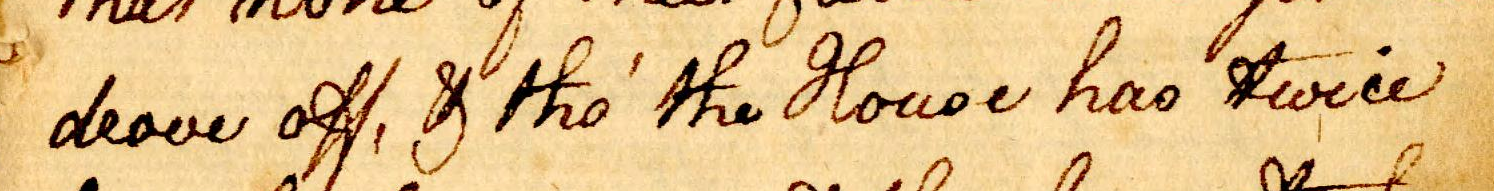drove off, & tho' the House has twice
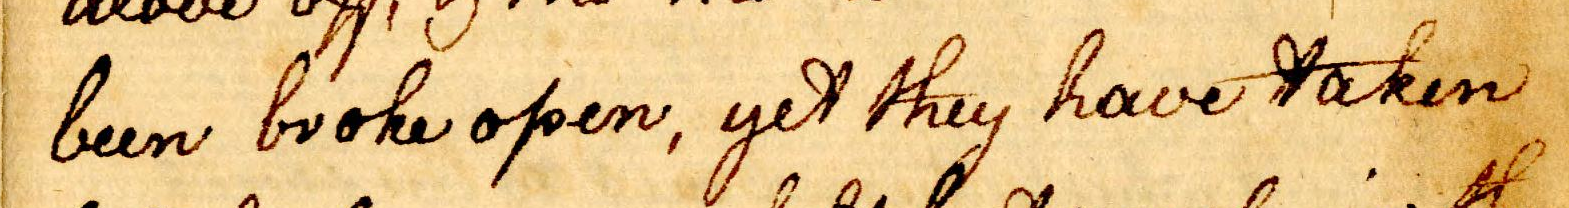been broke open, yet they have taken
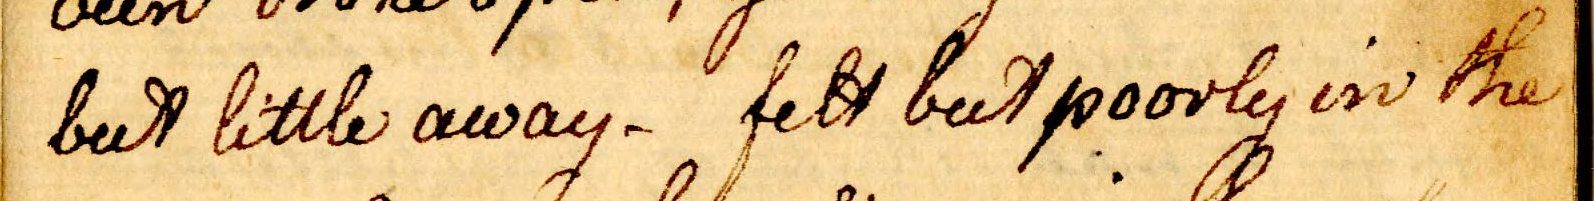but little away- felt but poorly in the
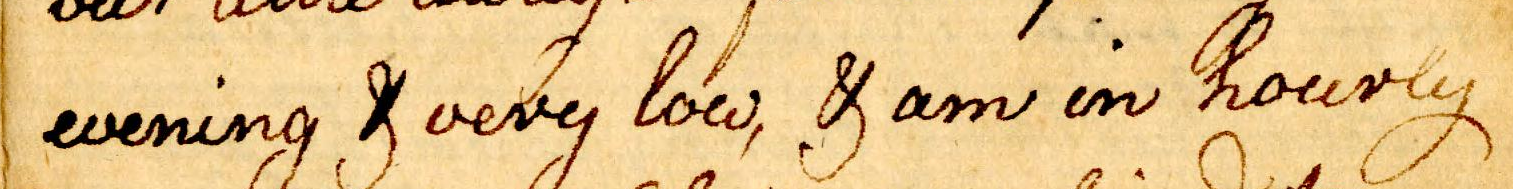evening & very low, & am in hourly
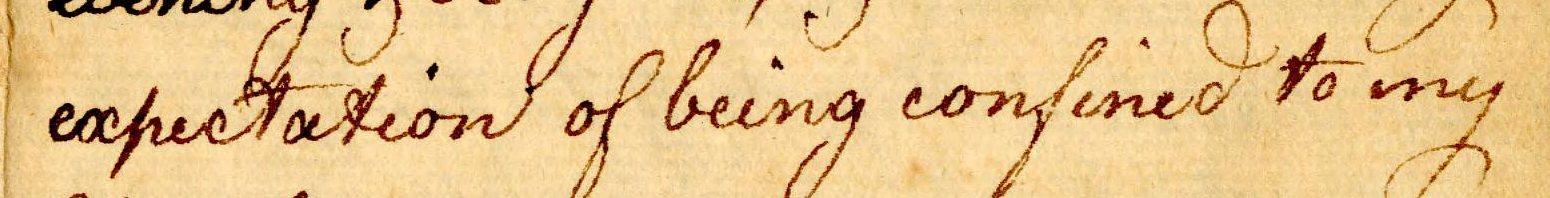expectation of being confined to my
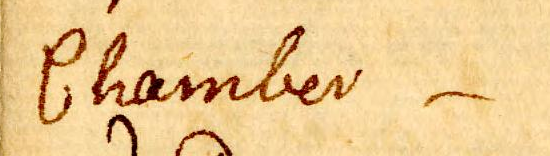Chamber-
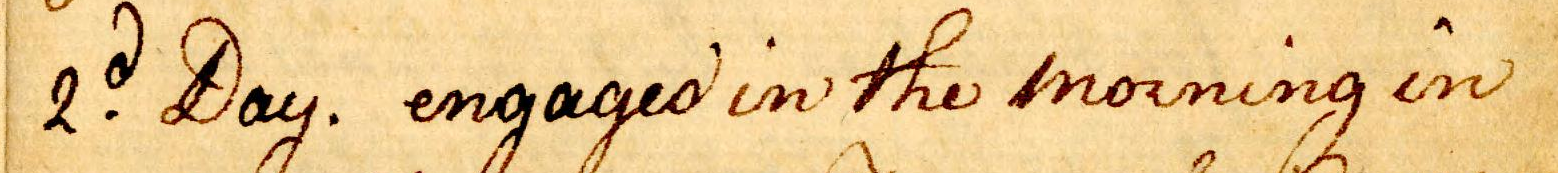2^d. Day. engaged in the morning in
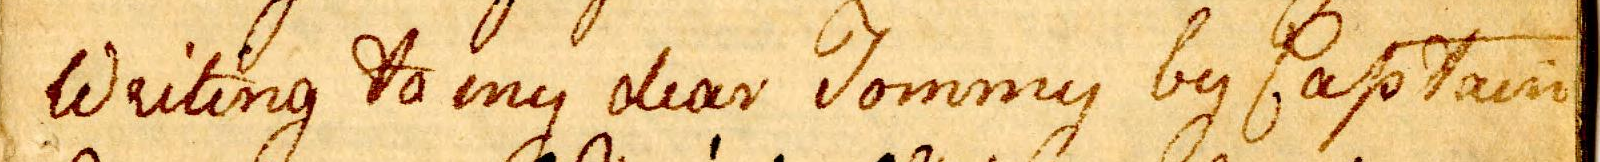Writing to my dear Tommy by Captain
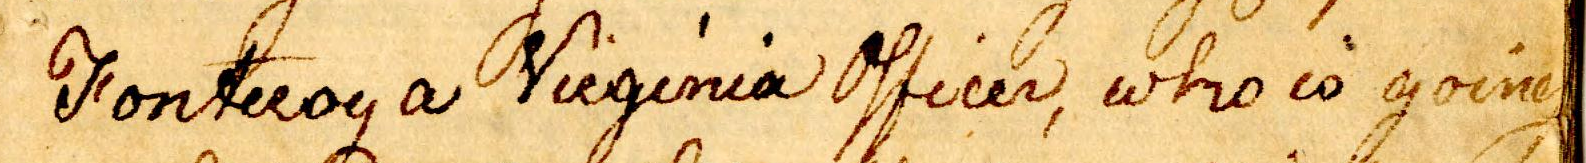Fontersy a Virginia Officer, who is going
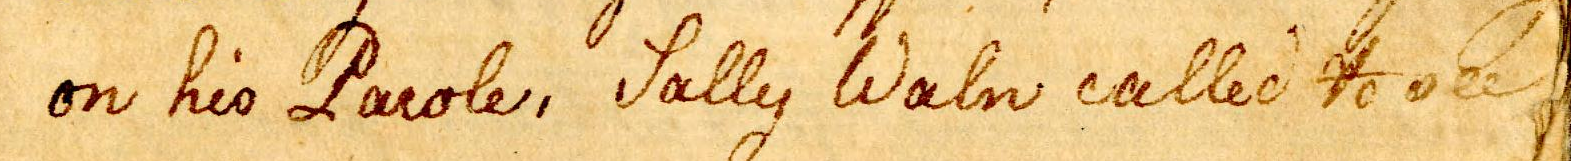on his Parole, Sally Waln called to see
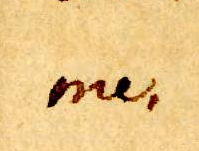me,
